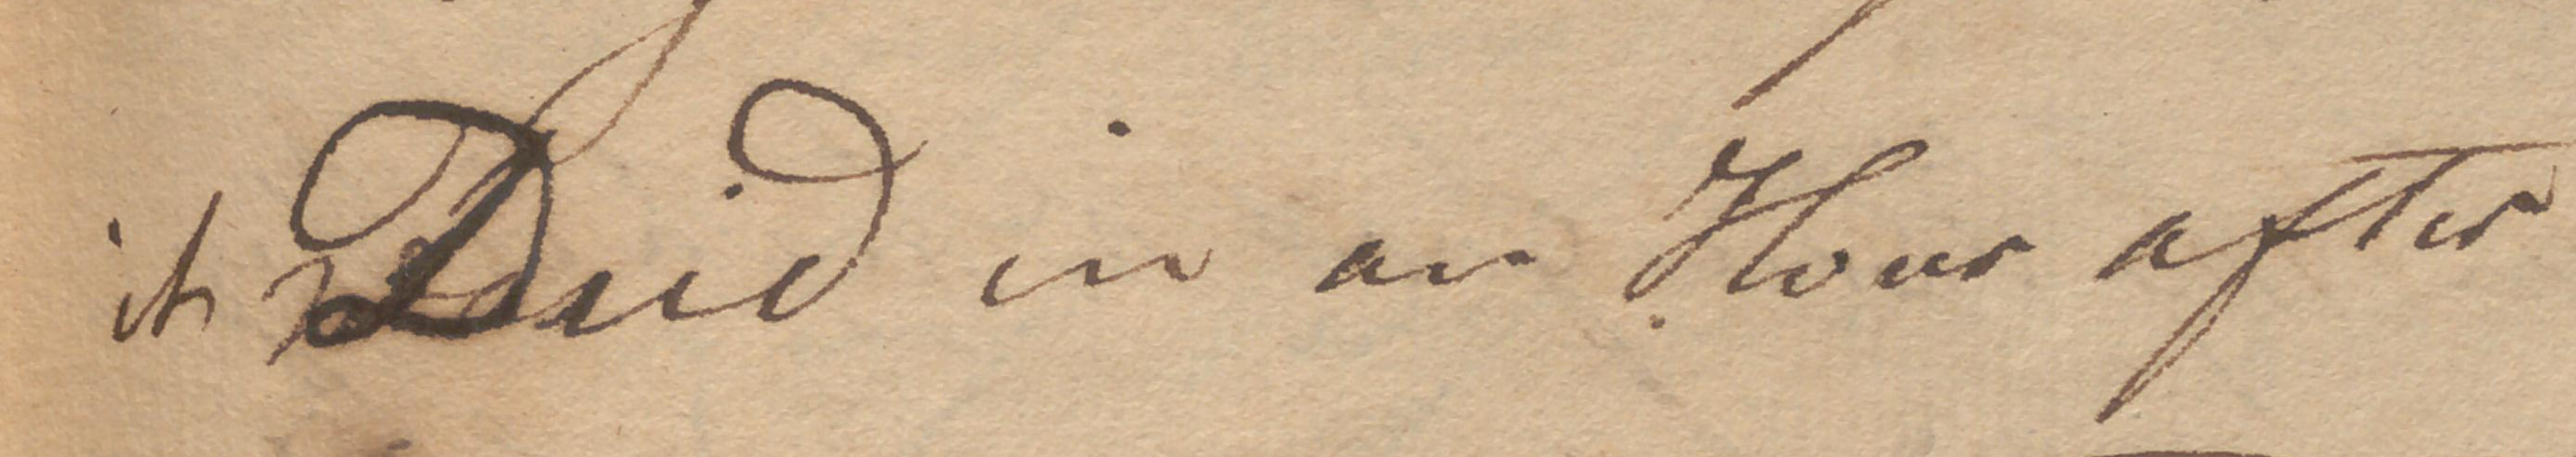it Died in an Hour after
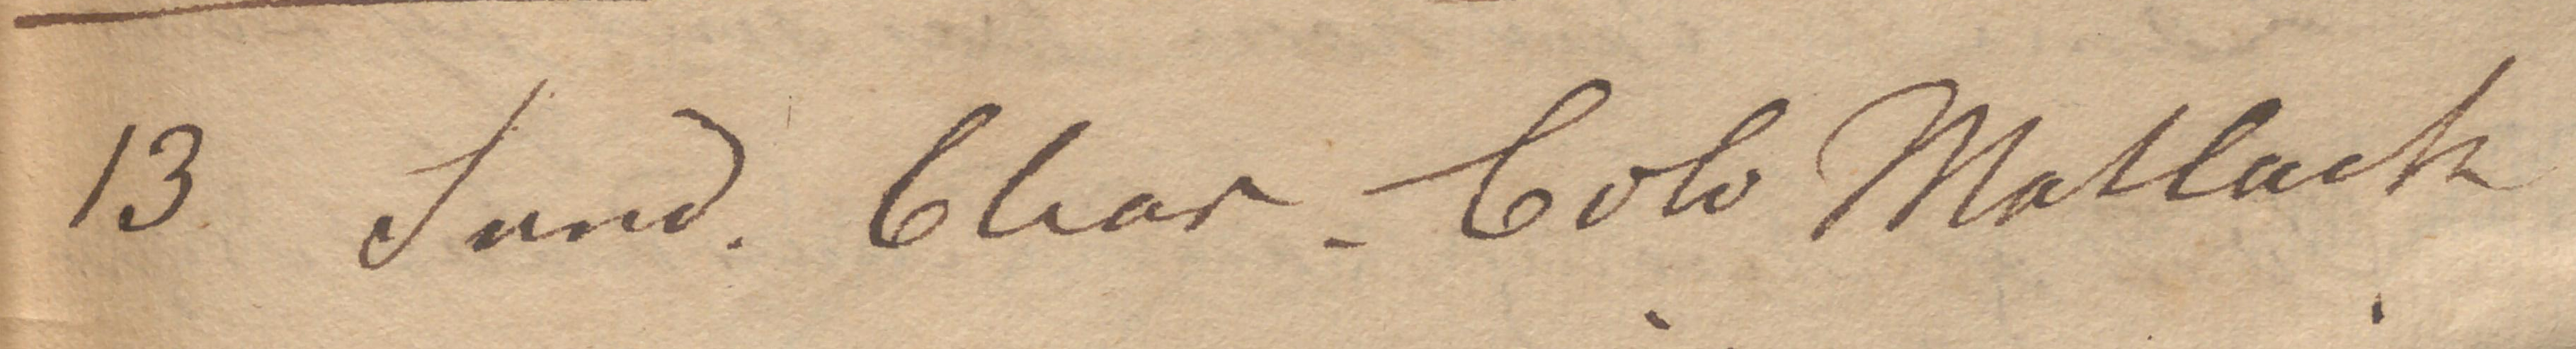13 Sund. Clear Colo Matlack
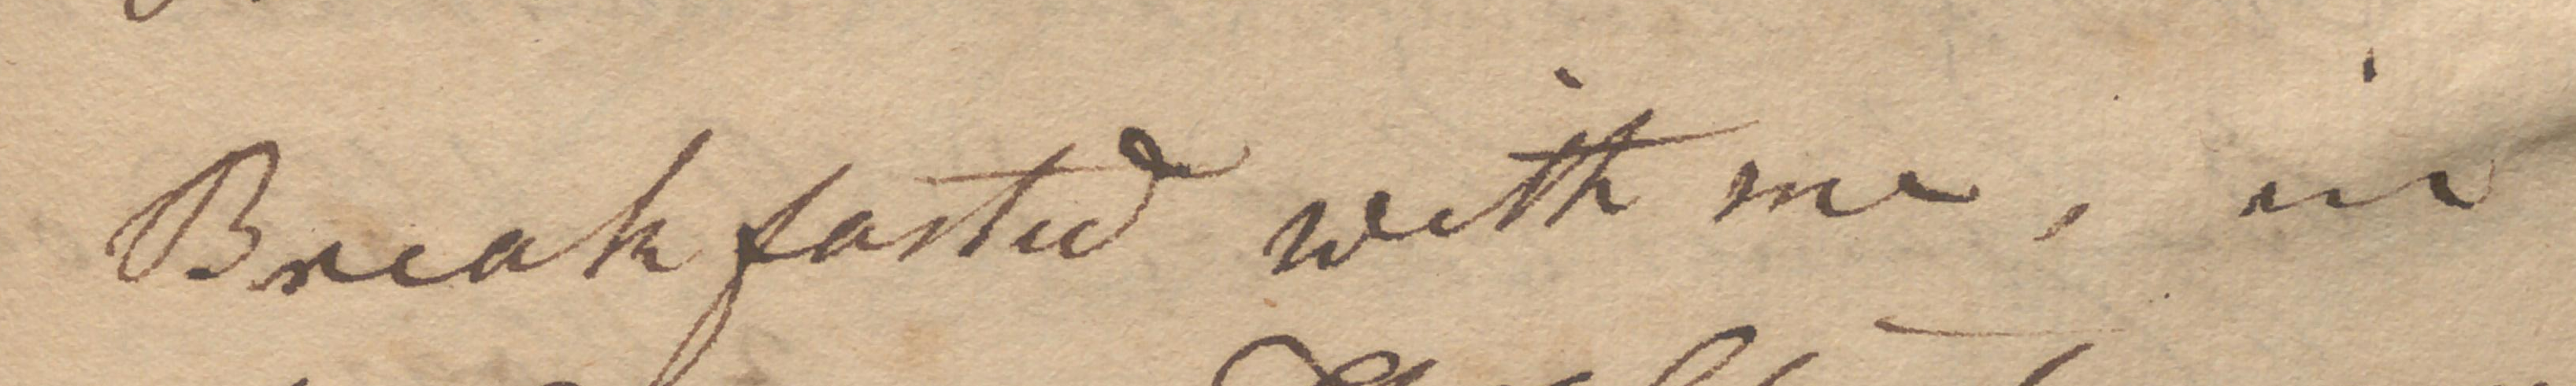Breakfasted with me, in
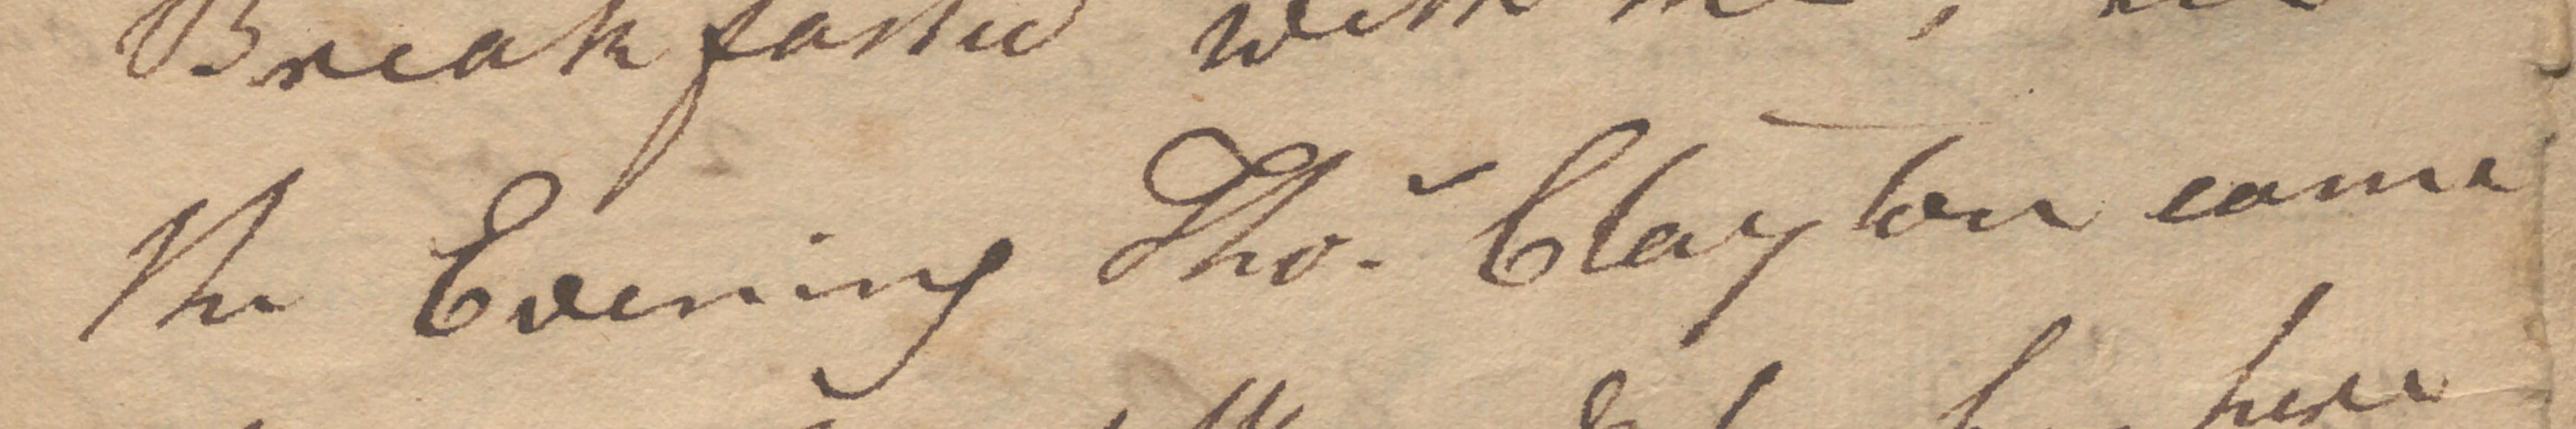the Evening Tho^s Clayton came
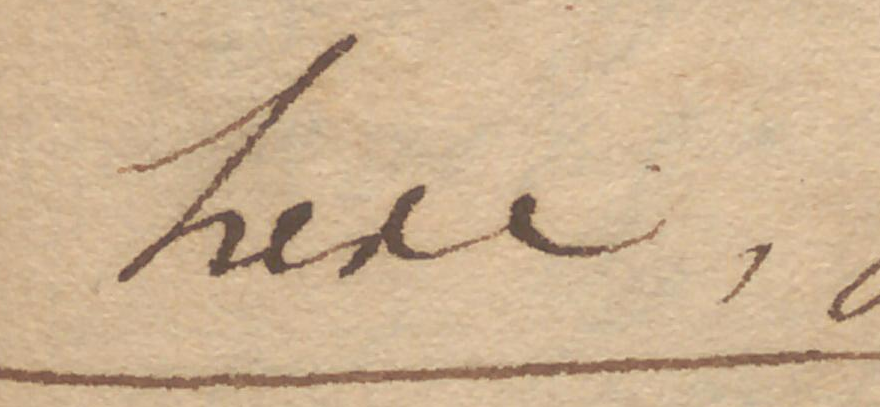here,
